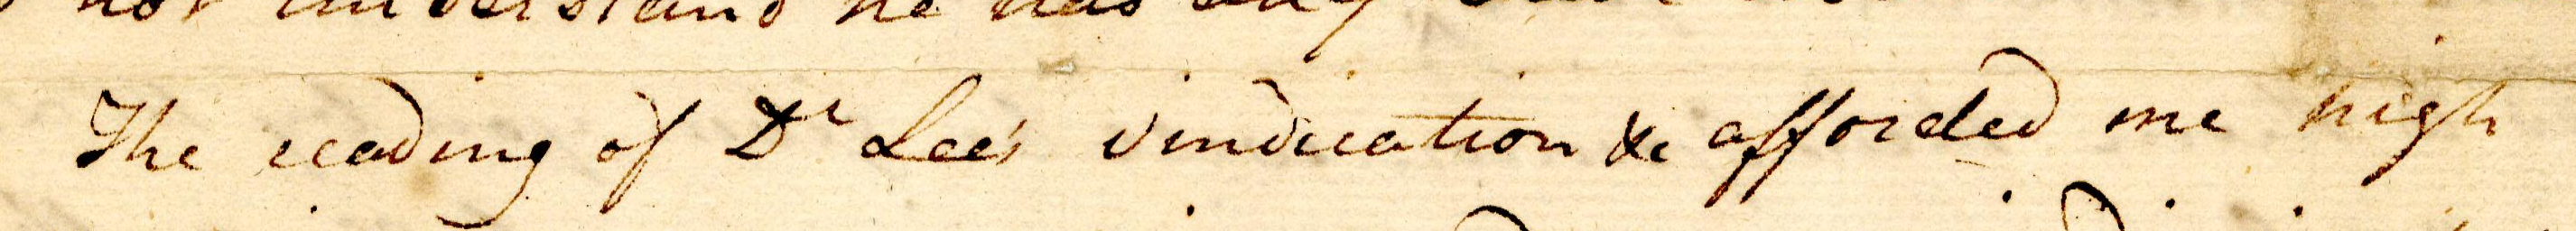The reading of D^r Lees indication &c afforded me high
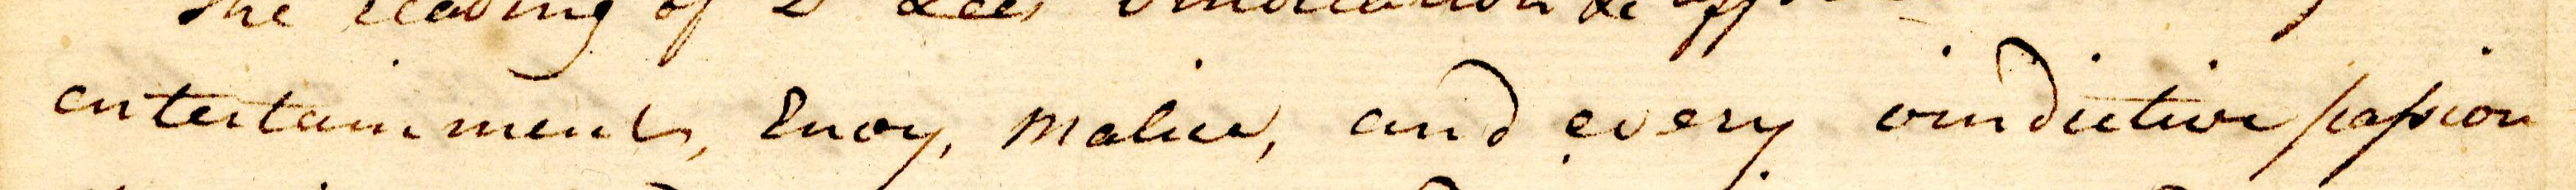entertainment, Envy, malice, and every vindictive passion
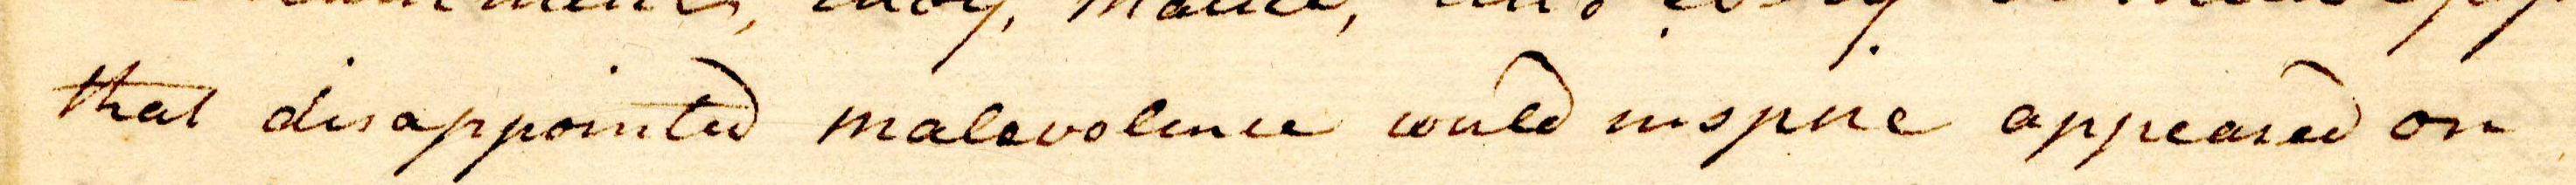that disappointed malevolence could inspire appeared on
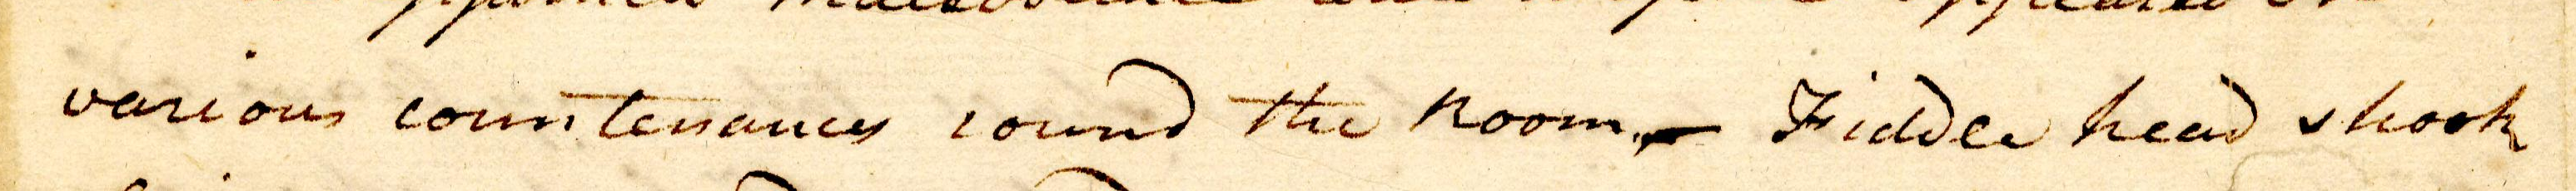various countenances round the room- Fiddle head shook
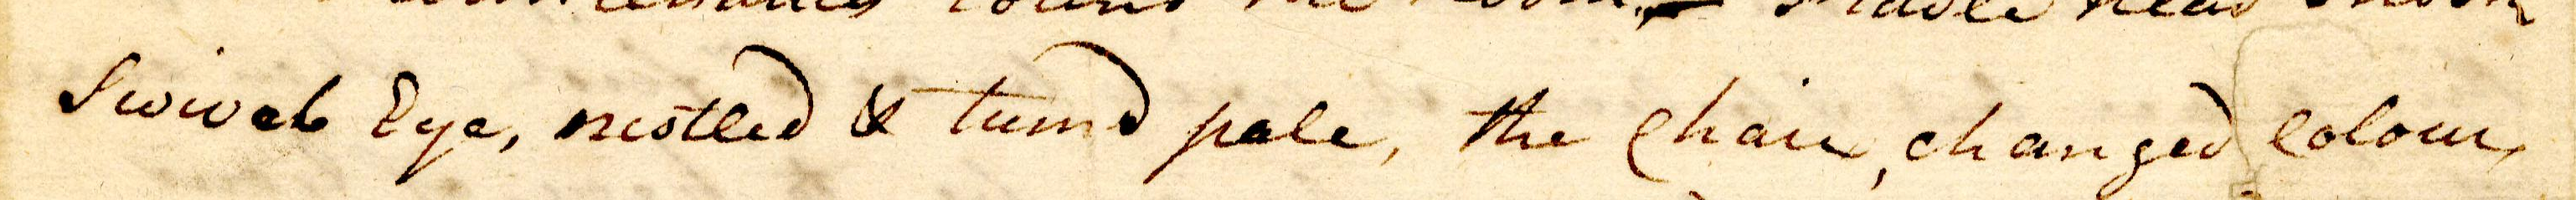swivel Eye, nestled & turnd pale, the chain, changed colour
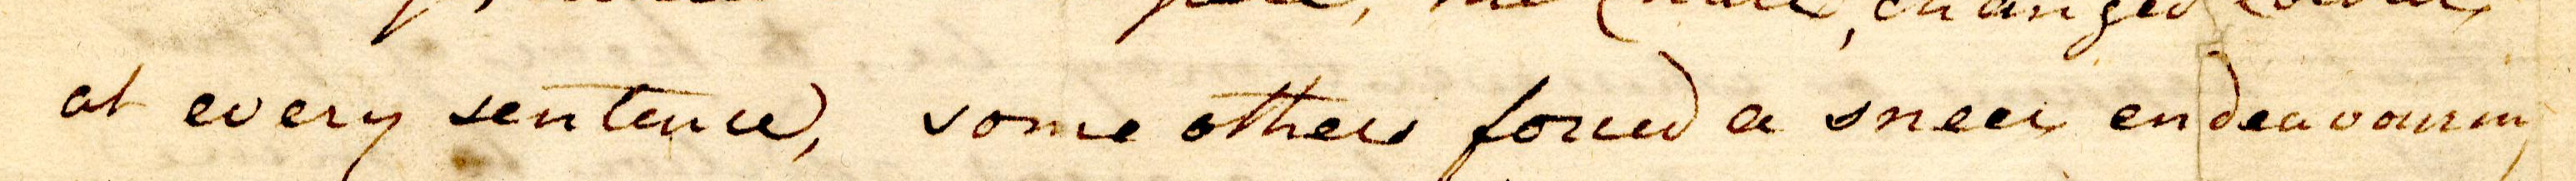at every sentence some others forced a sneer endeavoring
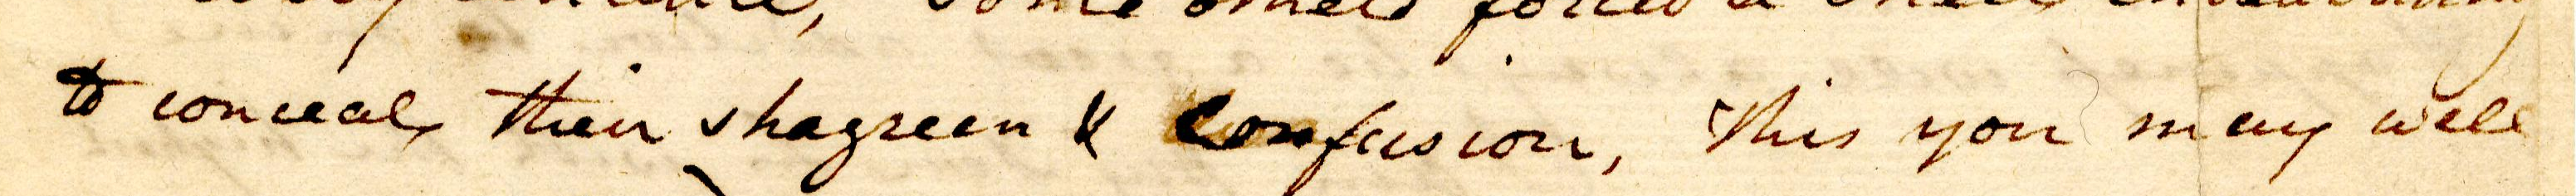to conceal then shagreen & Confusion, This you may will
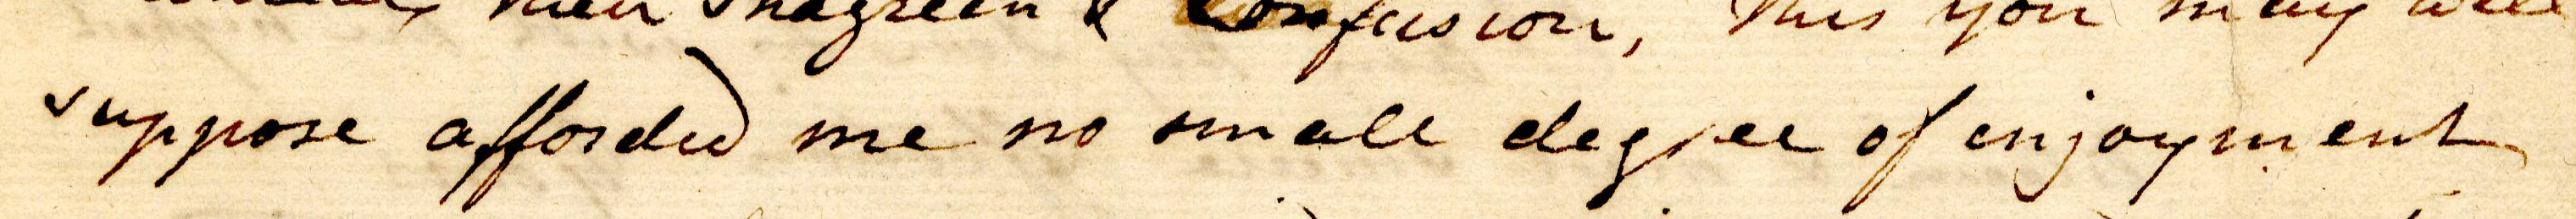suppose afforded me no small degree of enjoyment
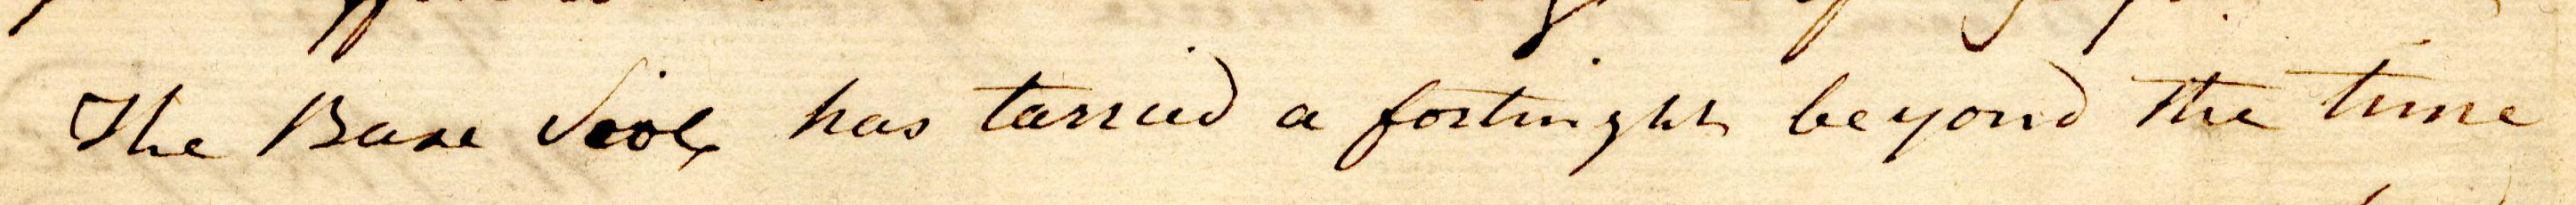The Base Seal has tarried a fortnight beyond the time
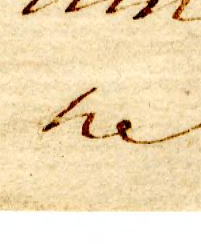he
